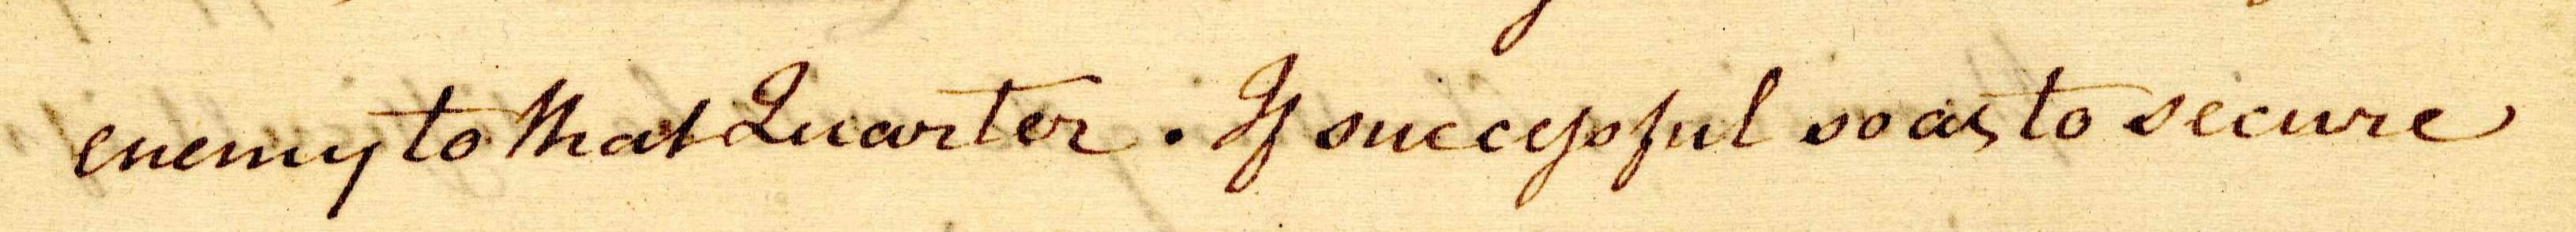enemy to that Quarter. If successful so as to secure
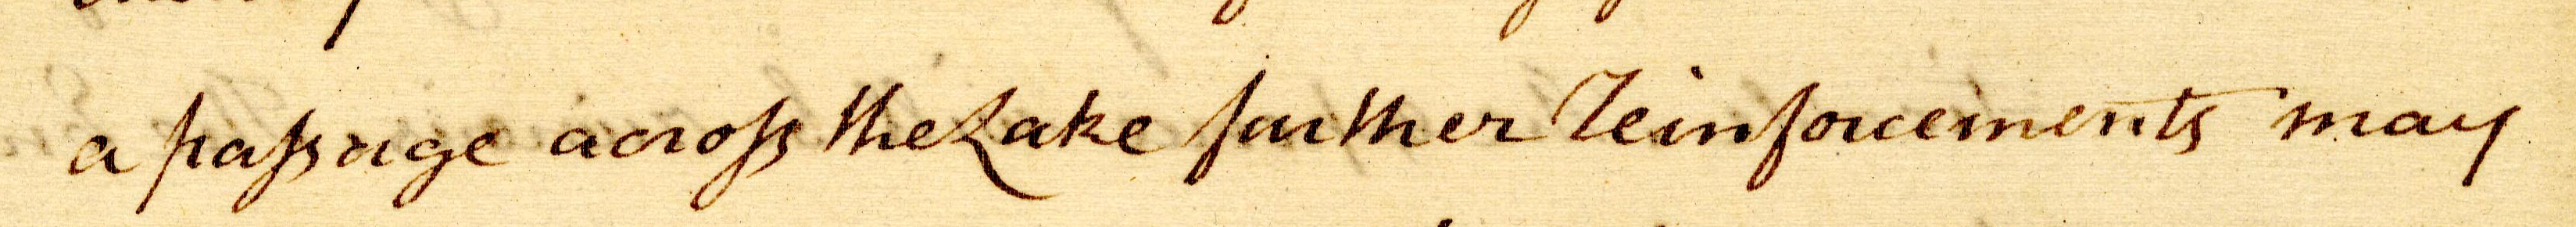a passage across the take farther reinforcements may
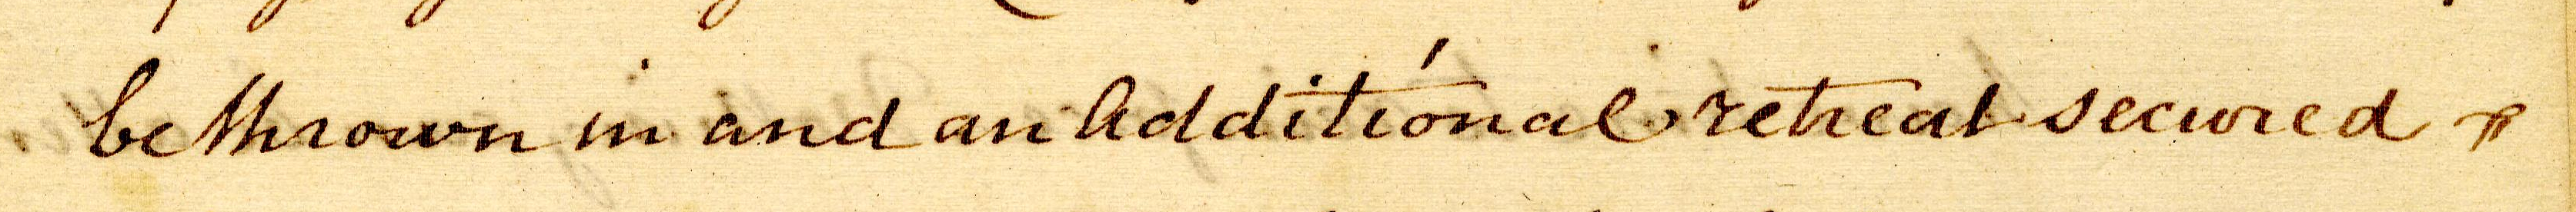be thrown in and an Additional retreat secured
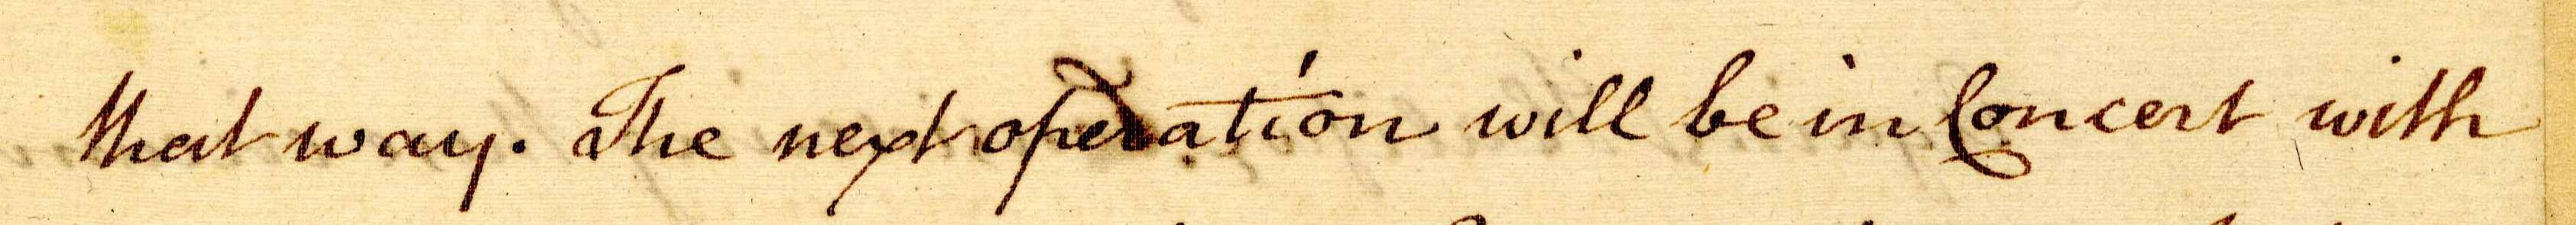that way. The next operation will be in Concert with
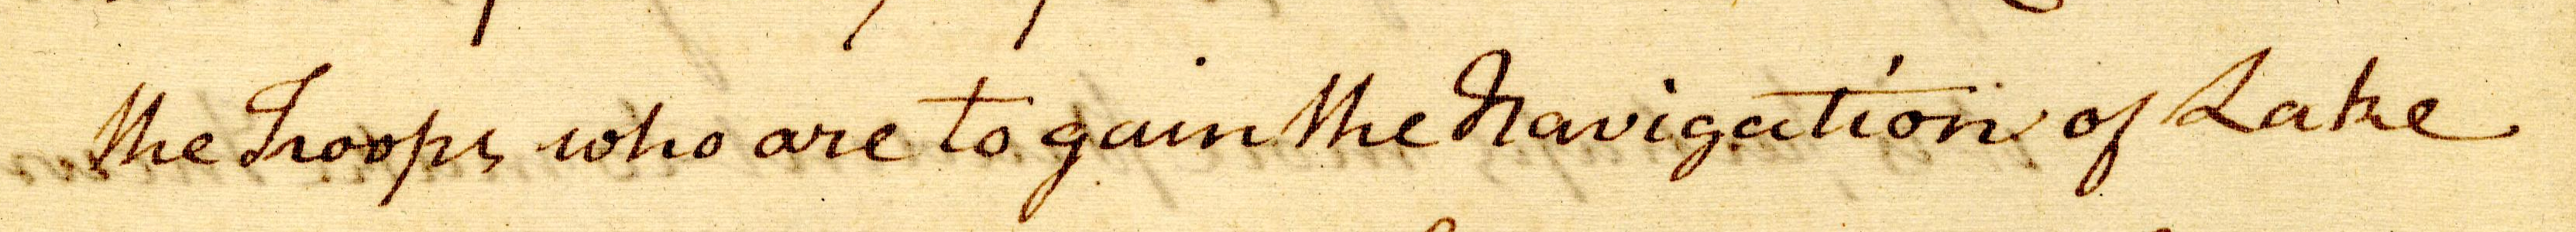the Troops who are to gain the Navigations of Lake
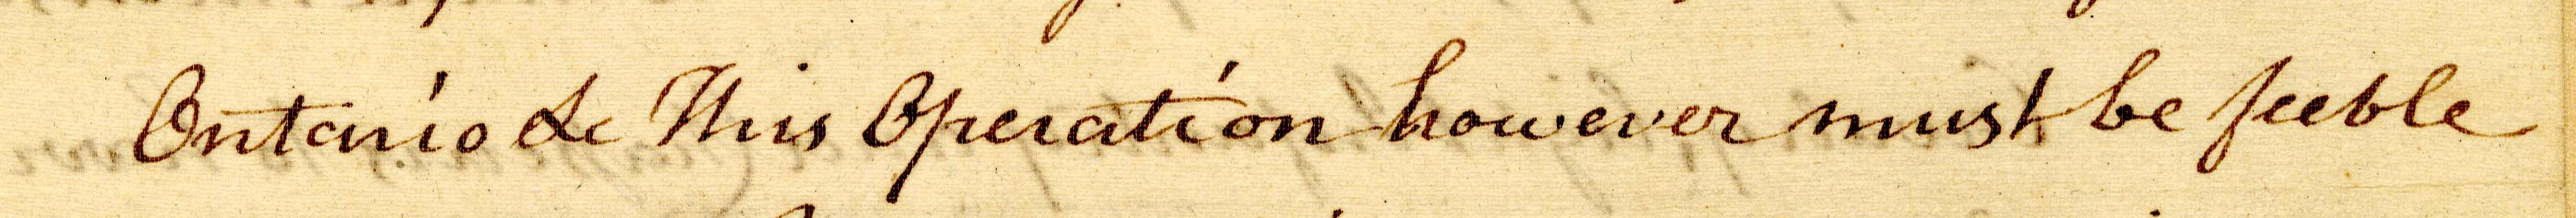Ontario &c this Operation however must be feeble
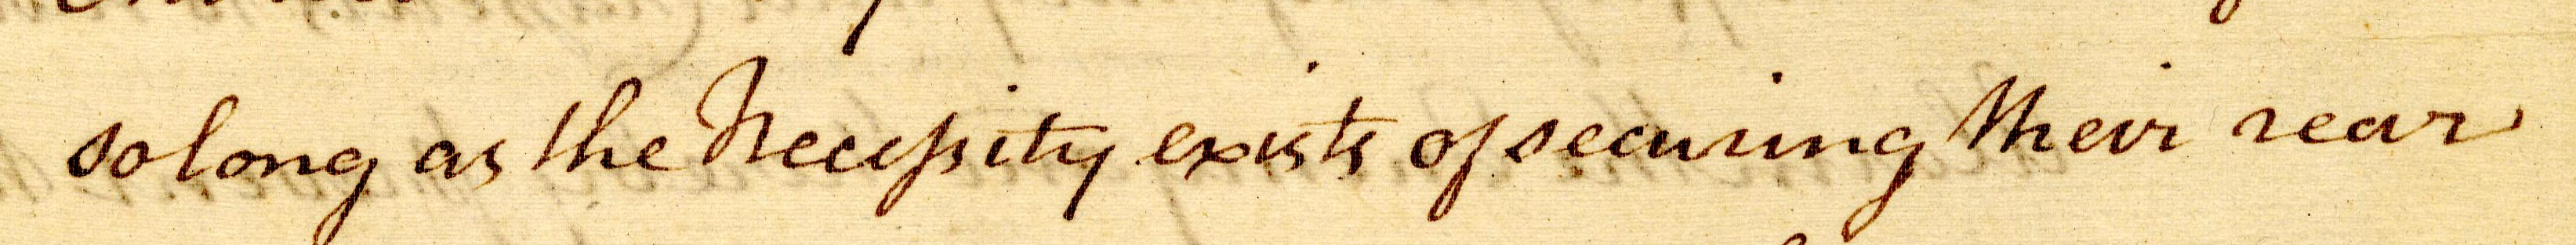so long as the Necessity exits of securing their rear
